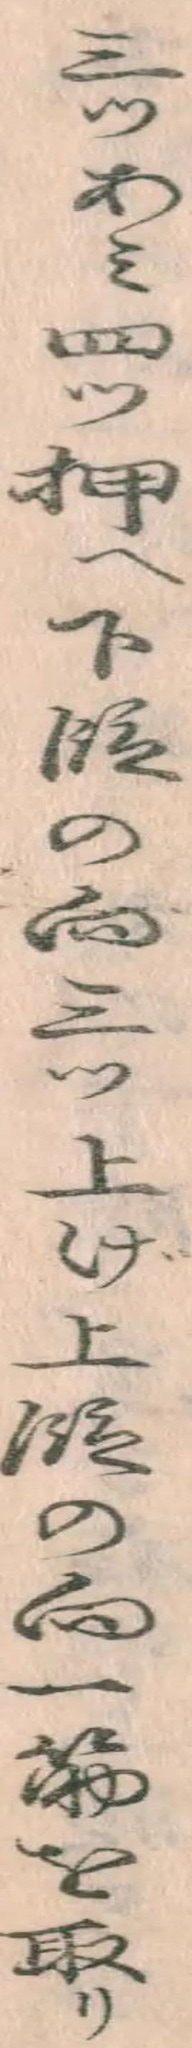三ッあみ四ッ押へ下段の向三ッ上げ上段の向一筋を取り
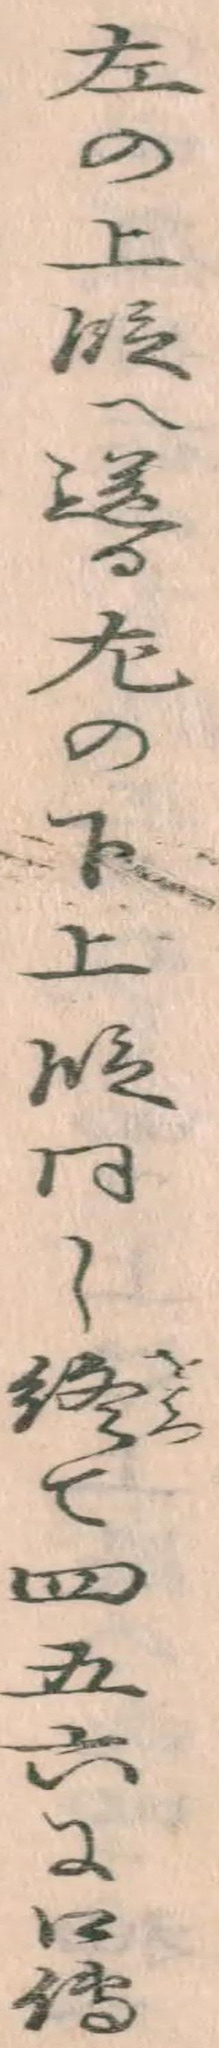左の上段へ送る左の下上段同し終て四五六に口伝
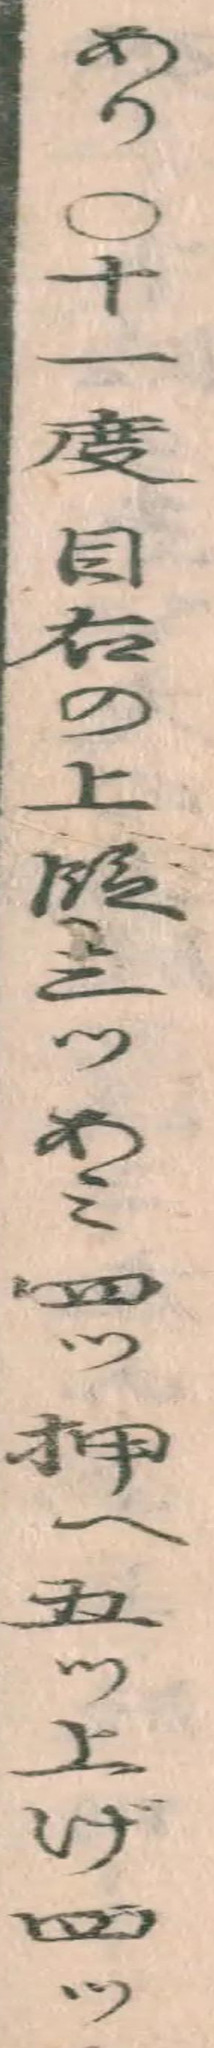あり○十一度目右の上段三ッあみ四ッ押へ五ッ上げ四ッ
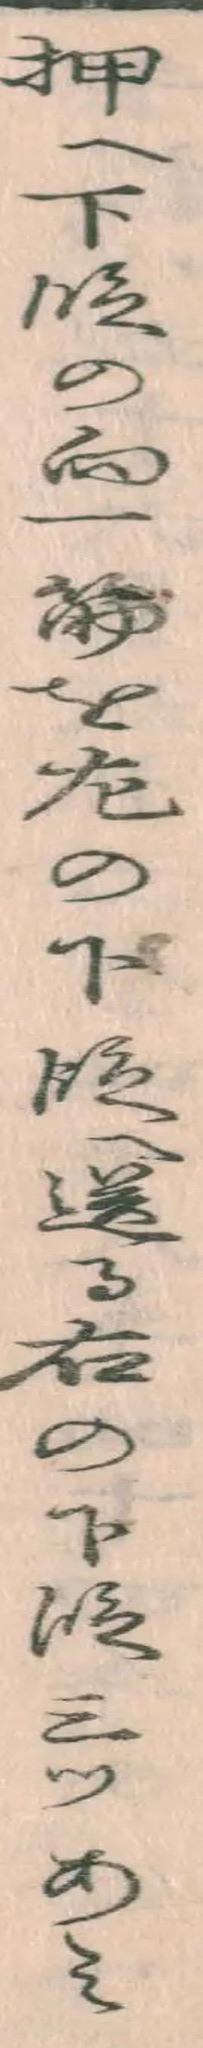押へ下段の向一筋を左の下段へ送る右の下段三ッあみ
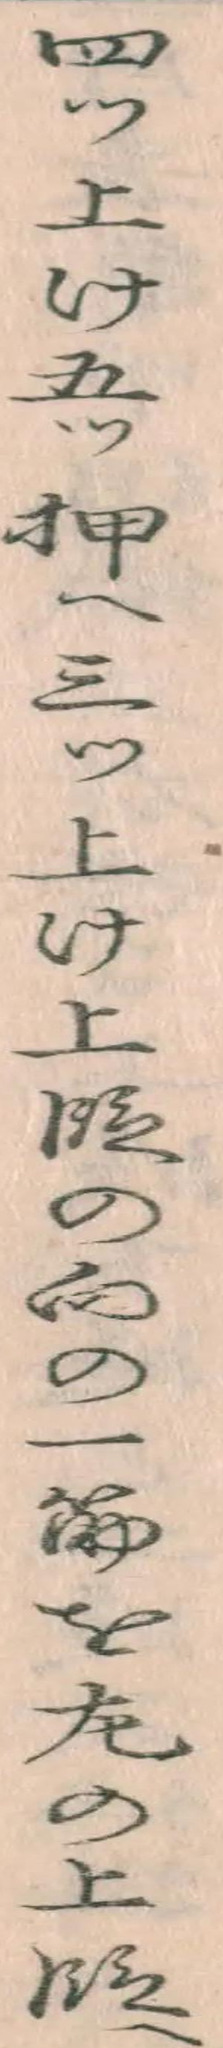四ッ上け五ッ押へ三ッ上け上段の向の一筋を左の上段へ
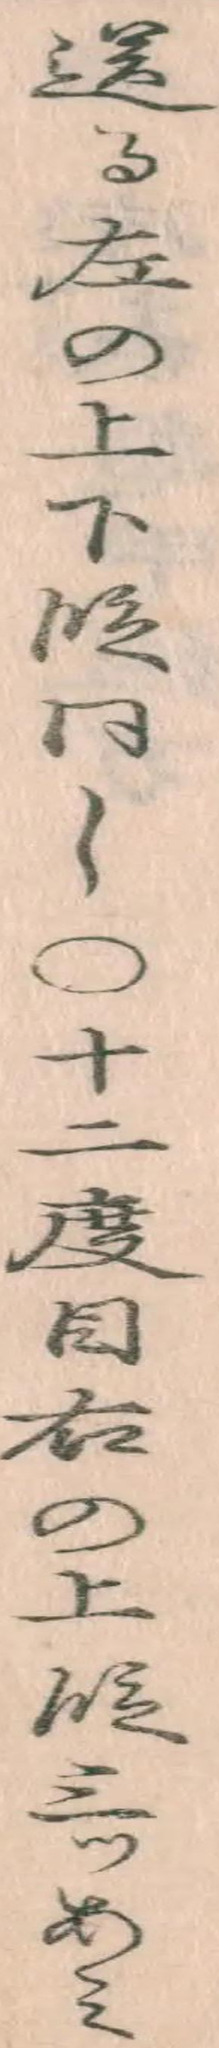送る左の上下段同し○十二度目右の上段三ッあみ
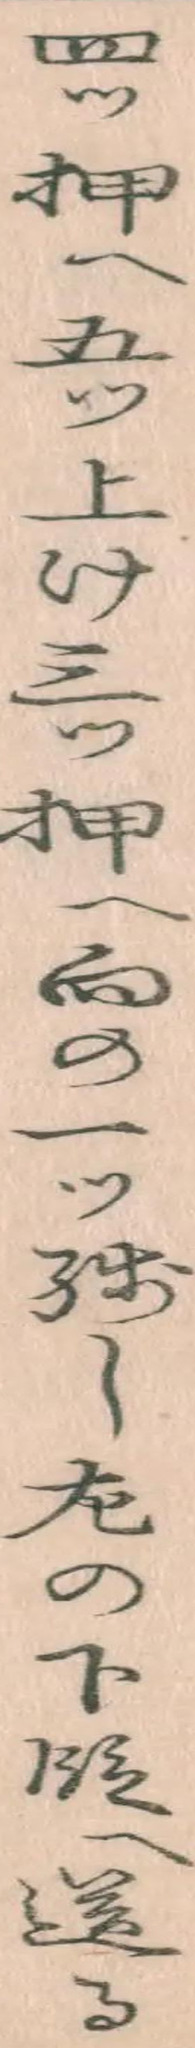四ッ押へ五ッ上け三ッ押へ向の一ッ残し左の下段へ送る
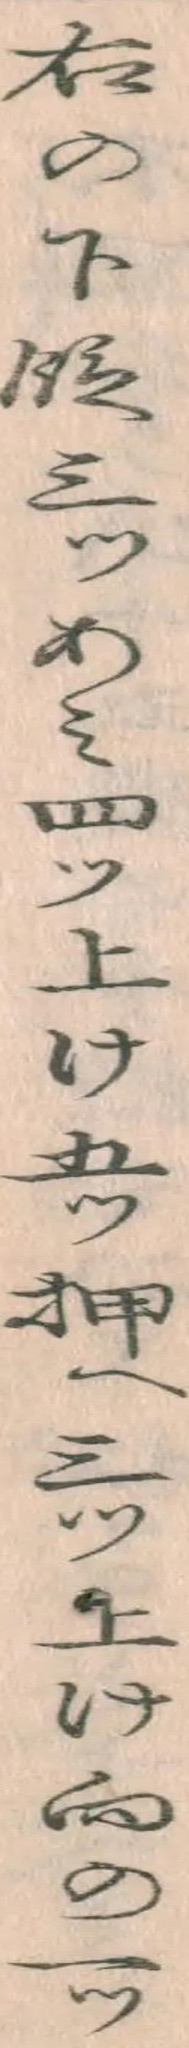右の下段三ッあみ四ッ上け五ッ押へ三ッ上け向の一ッ
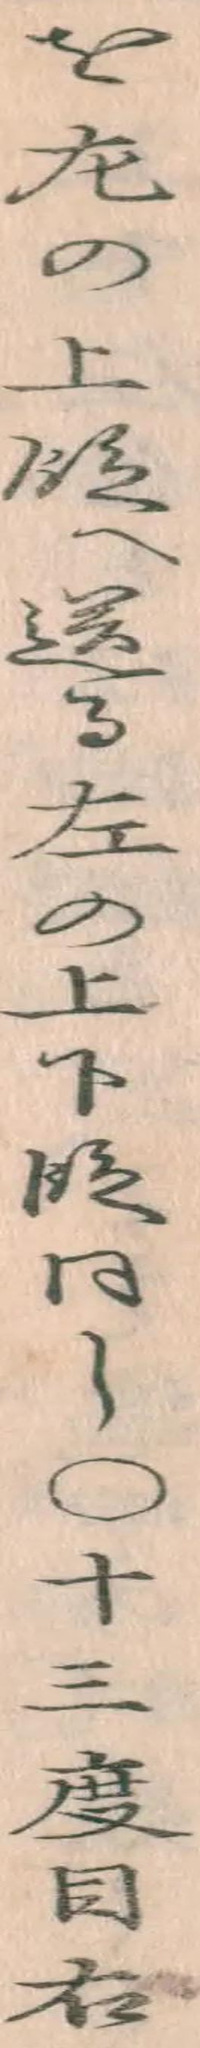を左の上段へ送る左の上下段同し○十三度目右
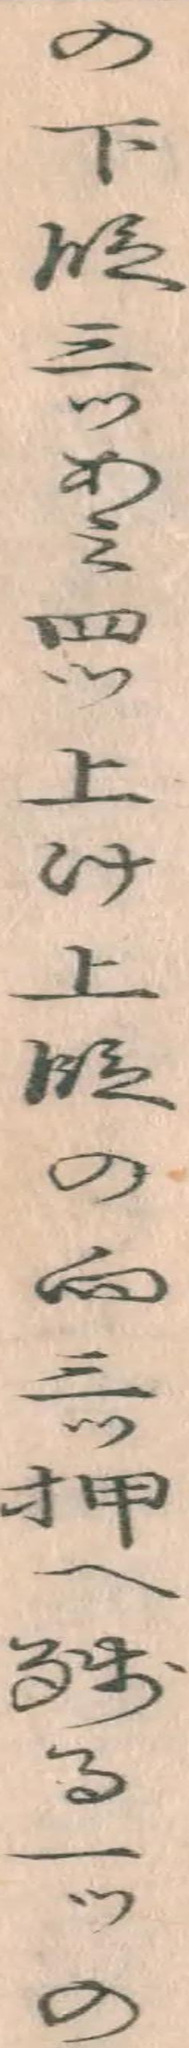の下段三ッあみ四ッ上け上段の向三ッ押へ残る一ッの
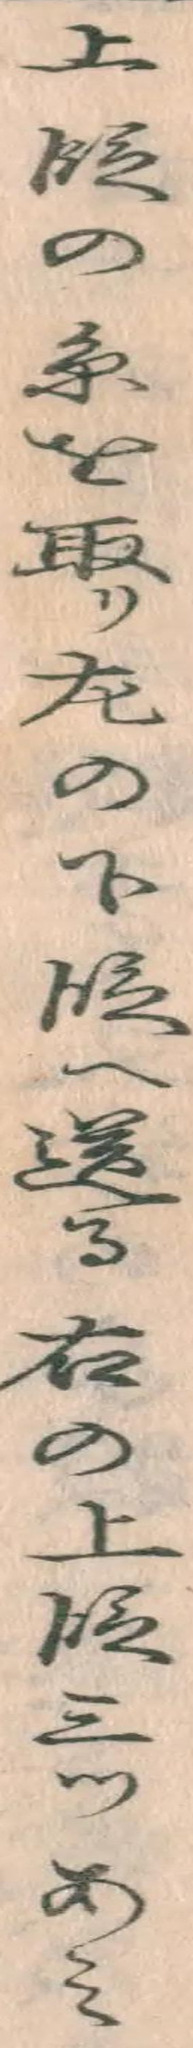上段の糸を取り左の下段へ送る右の上段三ッあみ
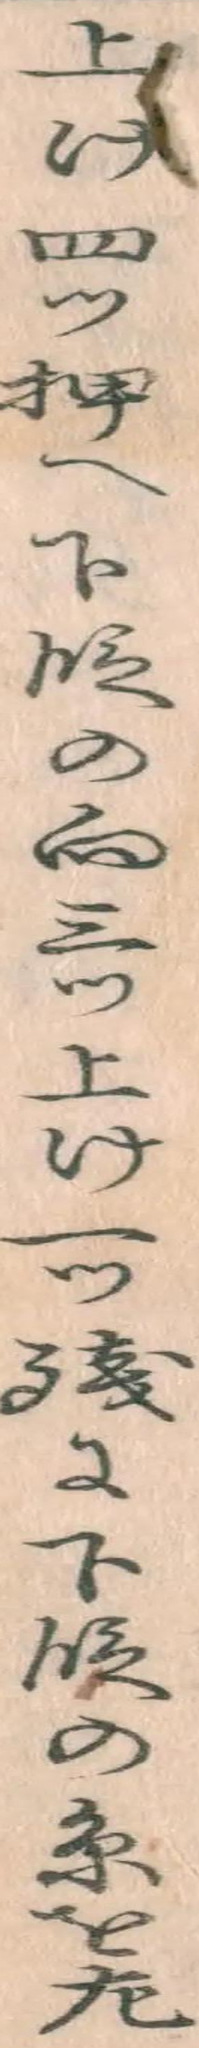上け四ッ押へ下段の向三ッ上け一ッ残に下段の糸を左
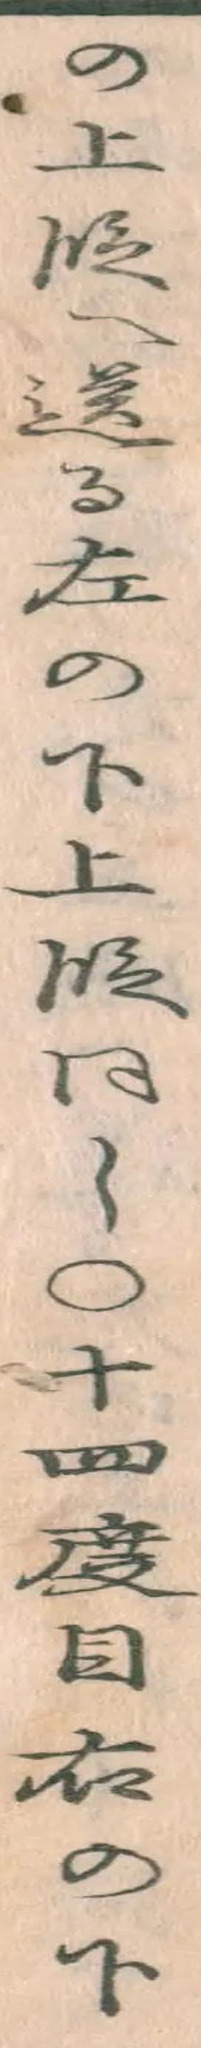の上段へ送る左の下上段同し○十四度目右の下
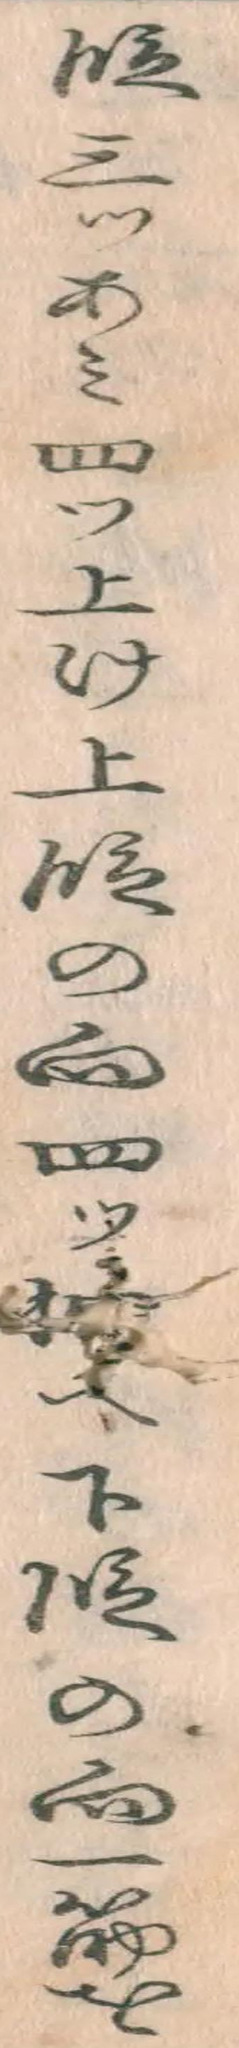段三ッあみ四ッ上け上段の向四ッ押へ下段の向一筋を
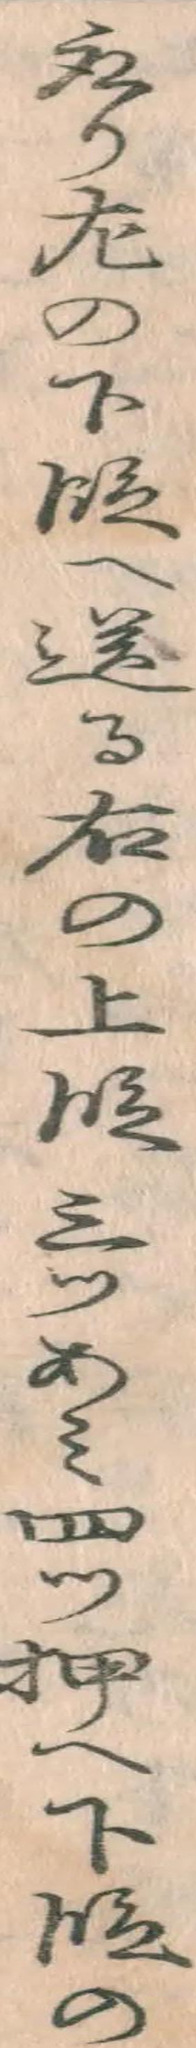取り左の下段へ送る右の上段三ッあみ四ッ押へ下段の
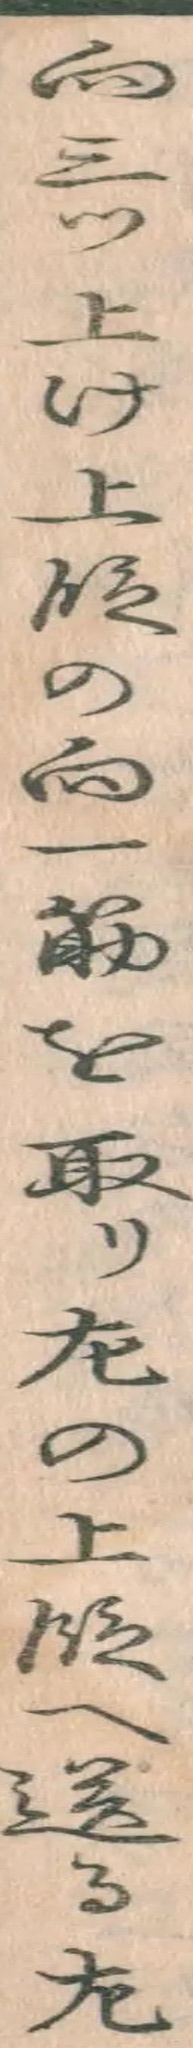向三ッ上け上段の向一筋を取り左の上段へ送る左
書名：機織彙編 5巻. [2]
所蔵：国立国会図書館 National Diet Library, JAPAN
